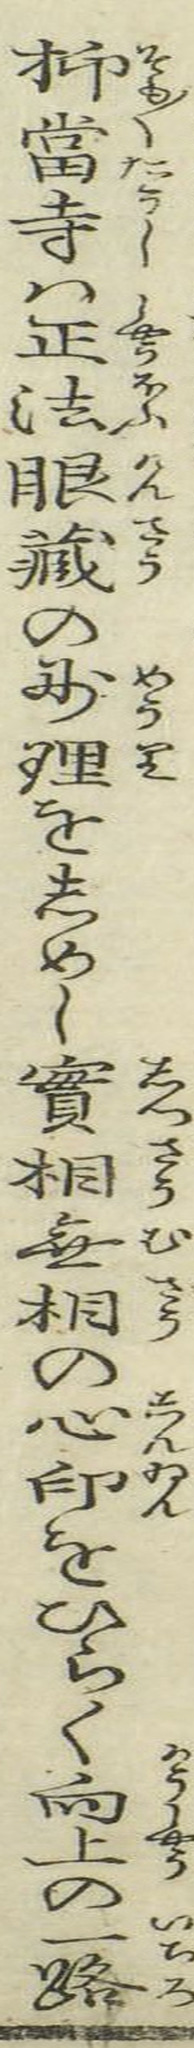抑当寺は正法眼蔵の妙理をしめし実相無相の心印をひらく向上の一路

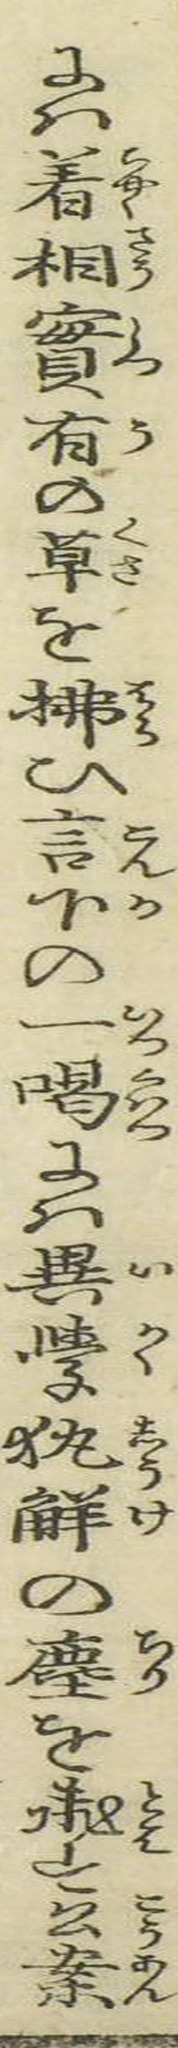には着相実有の草を払ひ言下の一喝には異学執解の塵をす公案
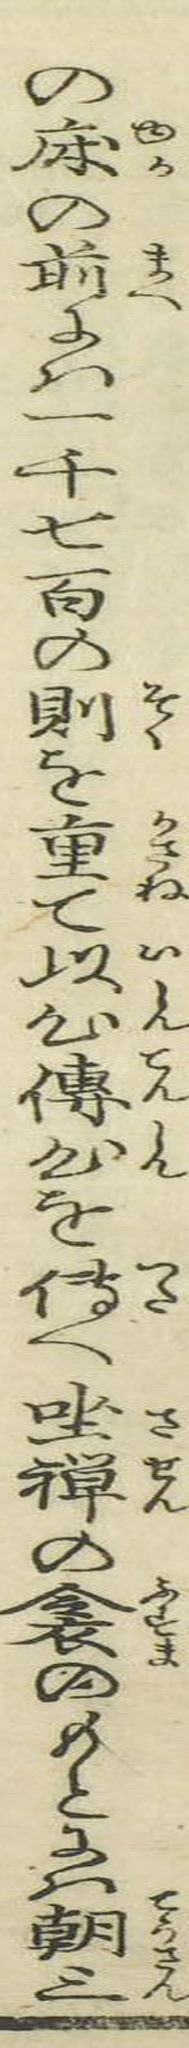の床の前には一千七百の則を重て以心伝心を伝へ坐禅の衾のもとには朝三
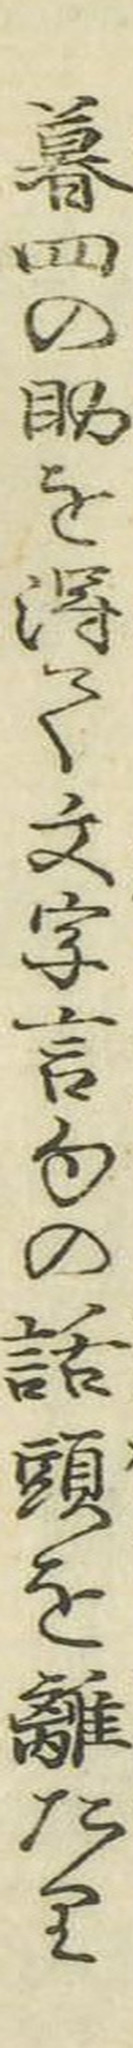暮四の助を得て文字言句の話頭を離たり
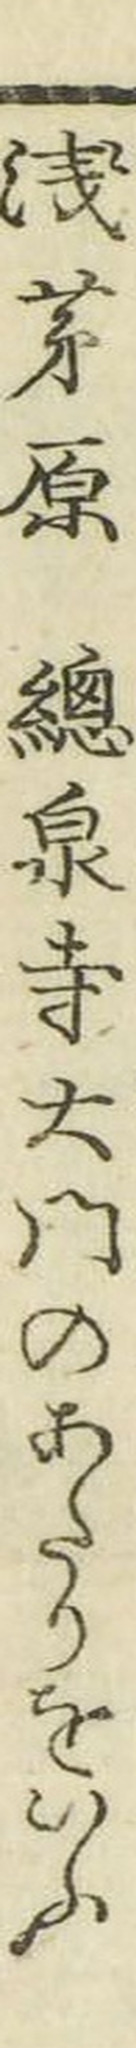浅茅原総泉寺大門のあたりをいふ
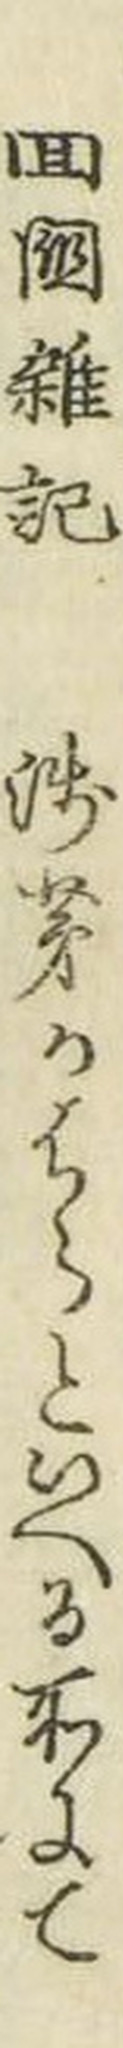回国雑記浅茅かはらといへる所にて
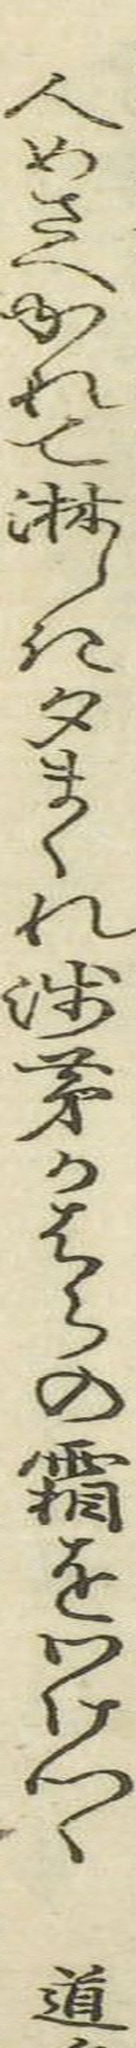人めさへかれて淋しき夕まくれ浅茅かはらの霜をわけつゝ道興准后
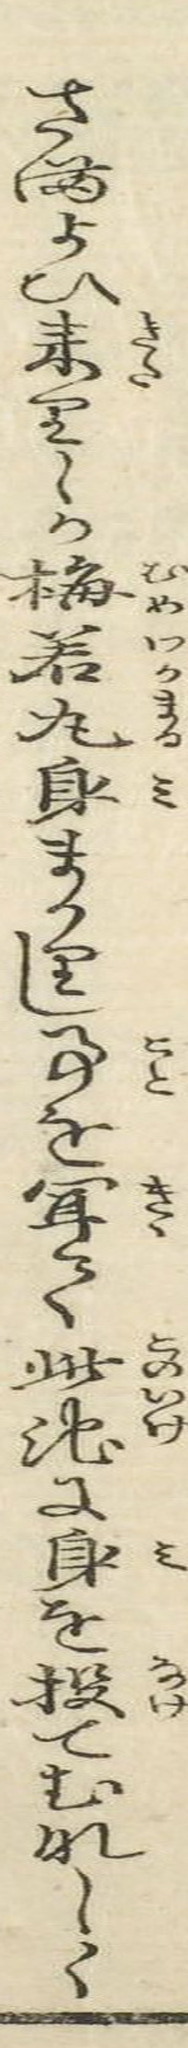さまよひ来りしか梅若丸身まかりし事を聞て此池に身を投てむなしく
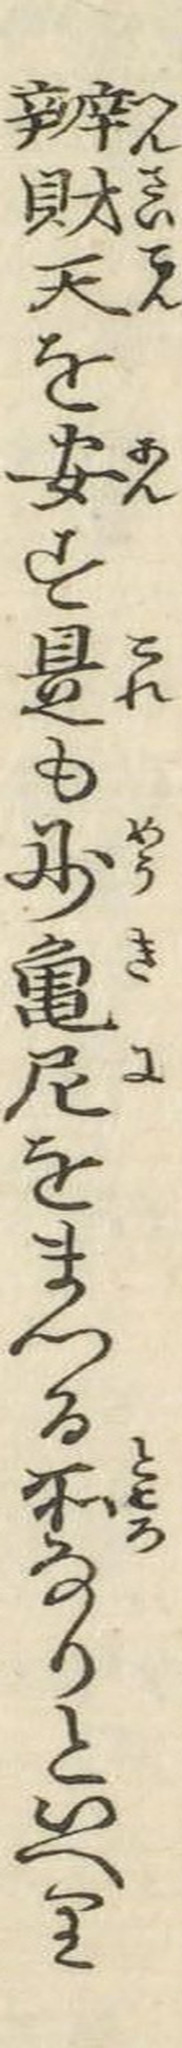弁財天を安す是も妙亀尼をまつる所なりといへり
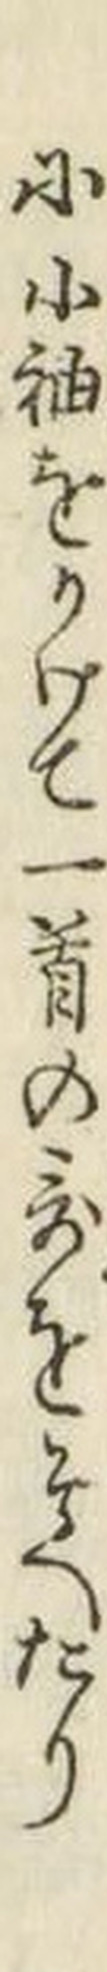に小袖をかけて一首の哥をそへたり
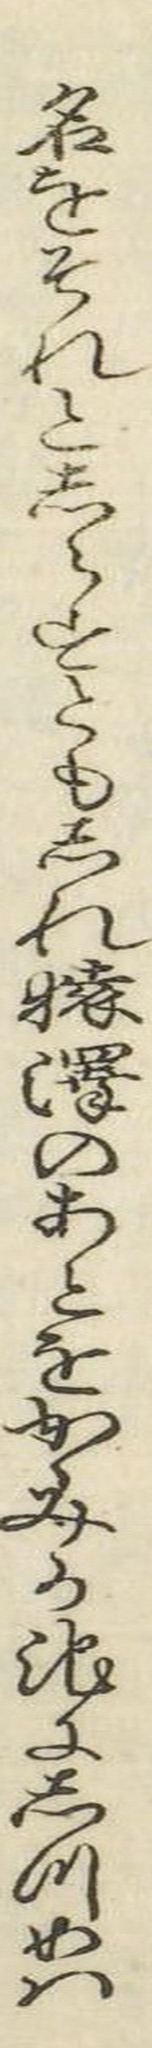名をそれとしらすともしれ猿沢のあとをかゝみか池にしつめは
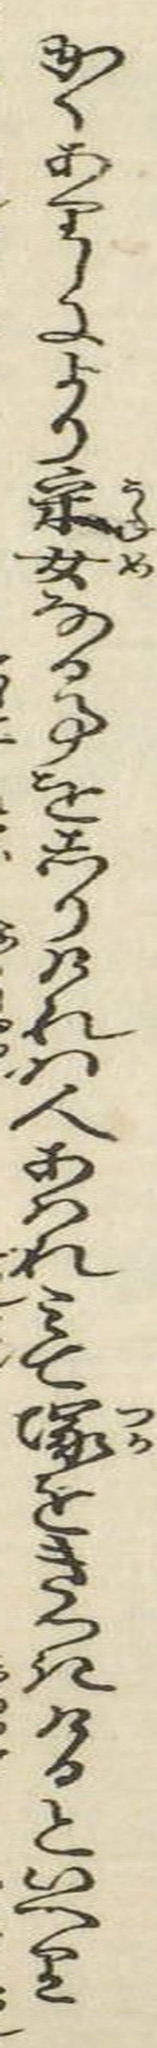かくありしにより采女なる事をしりけれは人あはれみて塚をきつきけるといへり
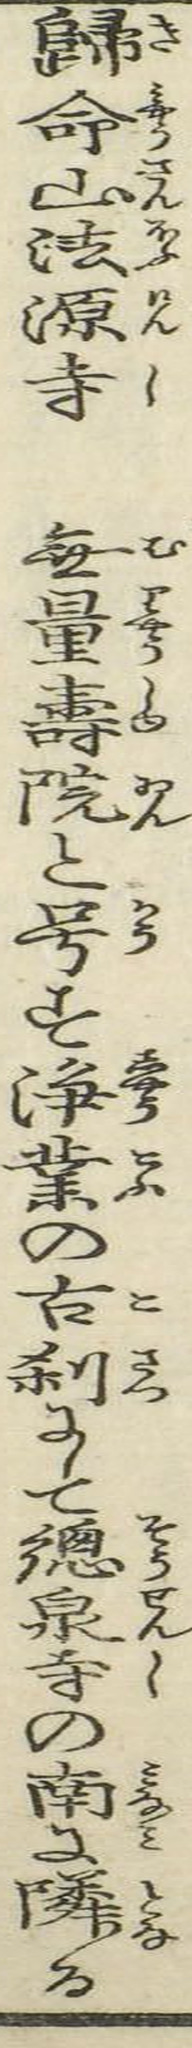帰命山法源寺無量寿院と号す浄業の古刹にして総泉寺の南に隣る
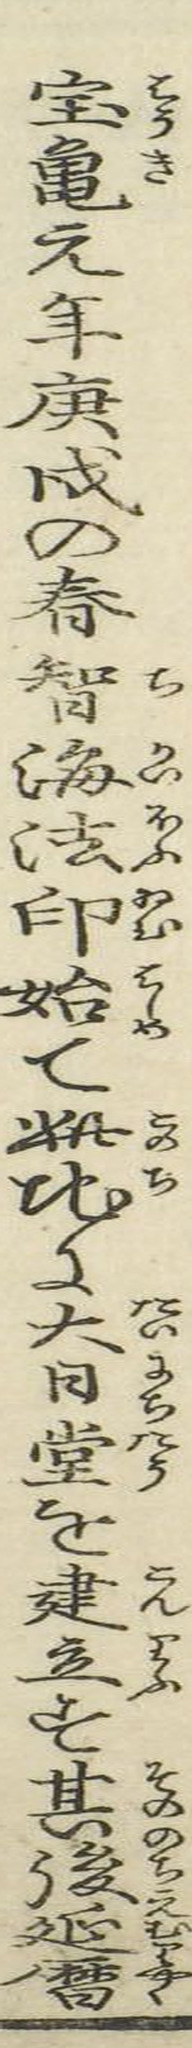宝亀元年庚戌の春智海法印始て此地に大日堂を建立す其後延暦
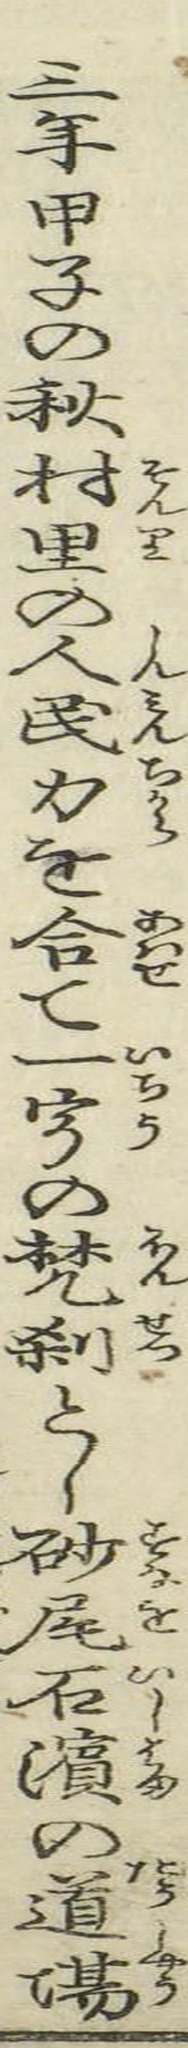三年甲子の秋村里の人民力を合て一宇の梵刹とし砂尾石浜の道場

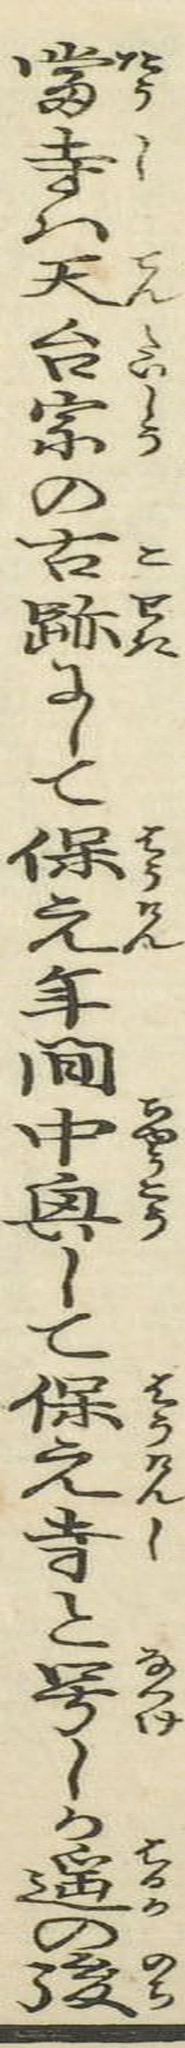当寺は天台宗の古跡にして保元年間中興して保元寺と号しか遥の後
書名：江戸名所図会 20巻 巻之17
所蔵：東京学芸大学教育コンテンツアーカイブ
